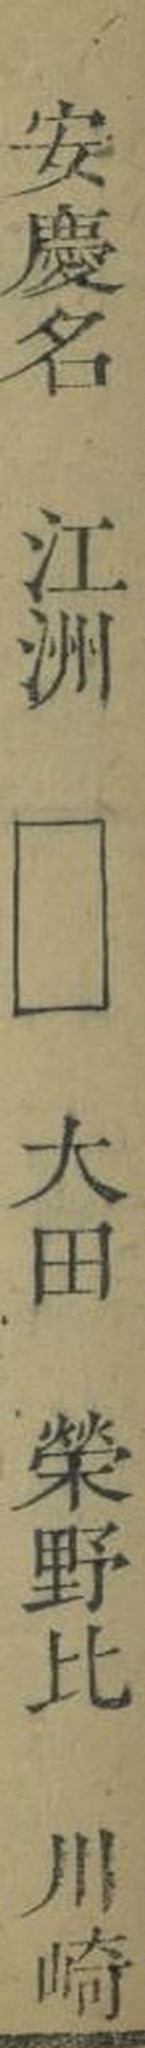安慶名江洲大田栄野比川崎
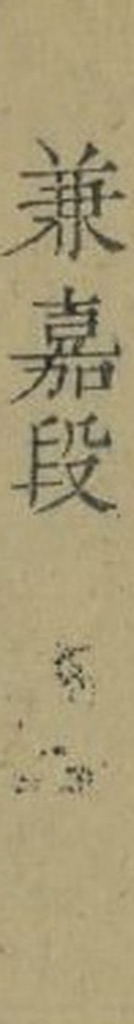兼嘉段
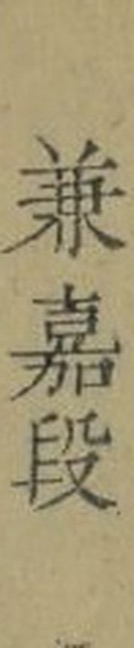兼嘉段
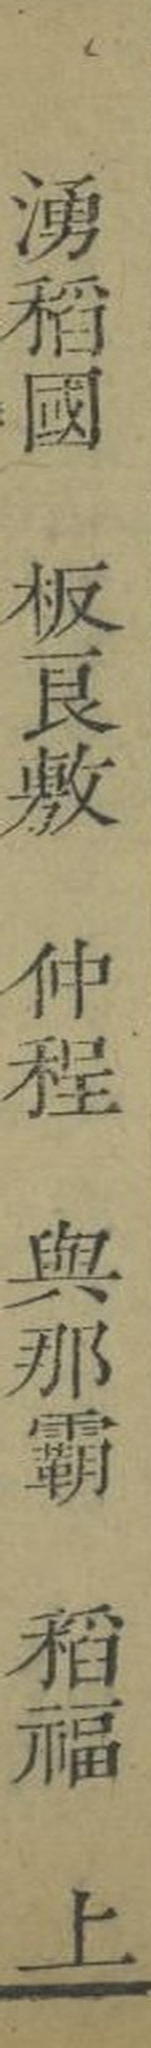湧稲国板良敷仲程与那覇稲福上
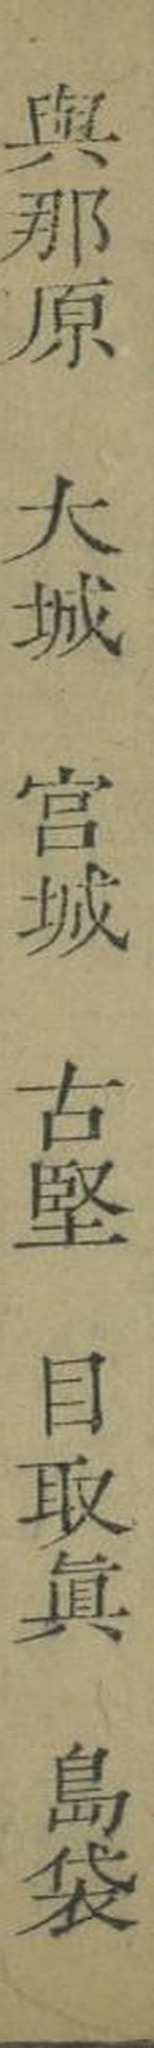与那原大城宮城古堅目取真島袋
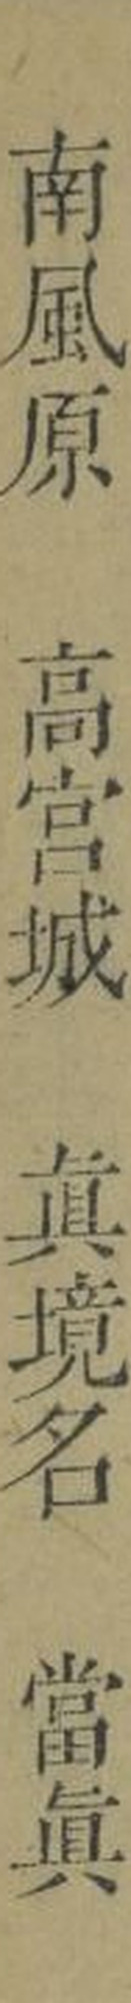南風原高宮城真境名当真

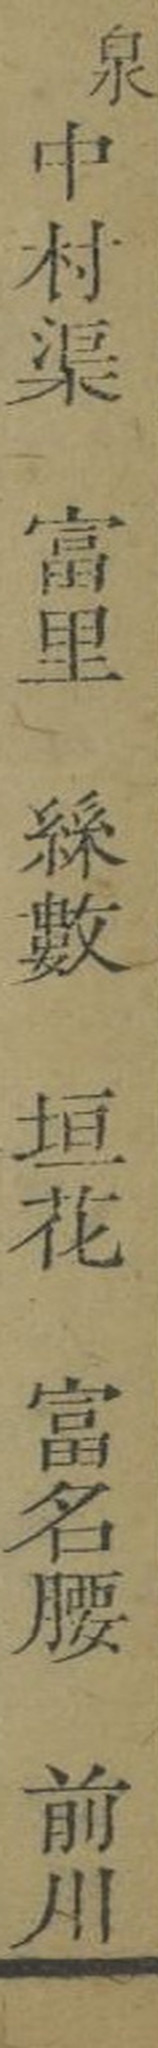泉中村渠富里糸数垣花富名腰前川
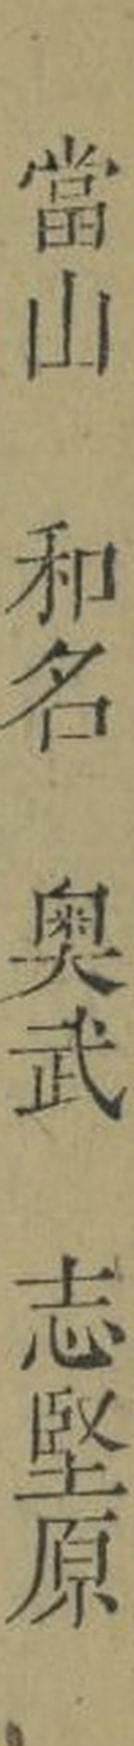当山和名奥武志堅原
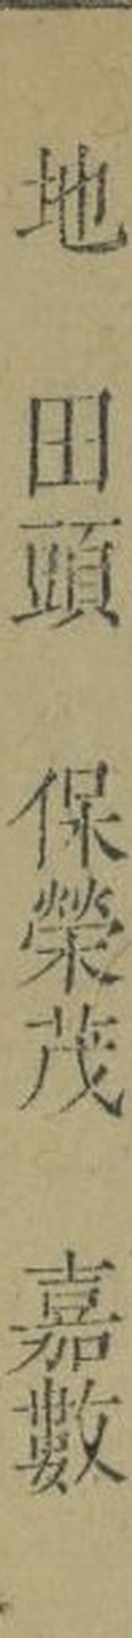地田頭保栄茂嘉数
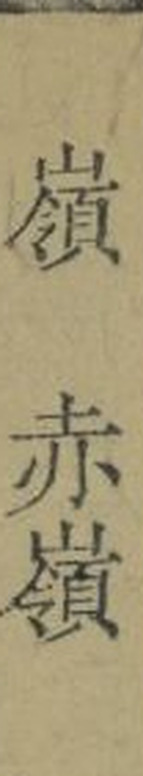嶺赤嶺

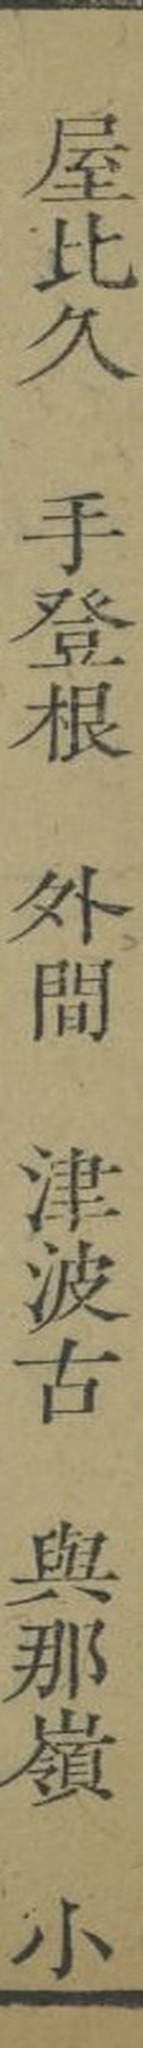屋比久手登根外間津波古与那嶺小
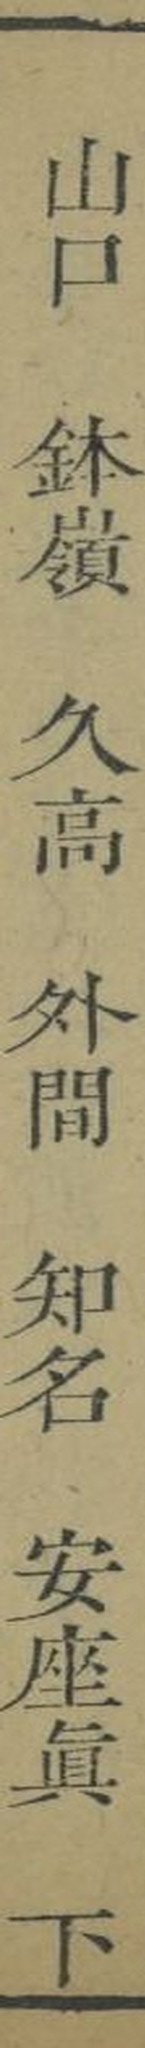山口鉢嶺久高外間知名安座真下
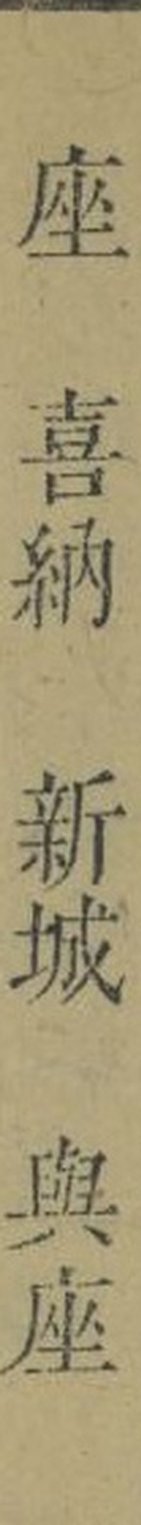座喜納新城与座
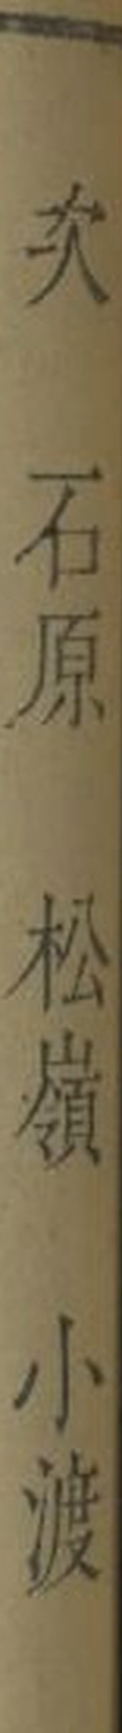次石原松嶺小渡
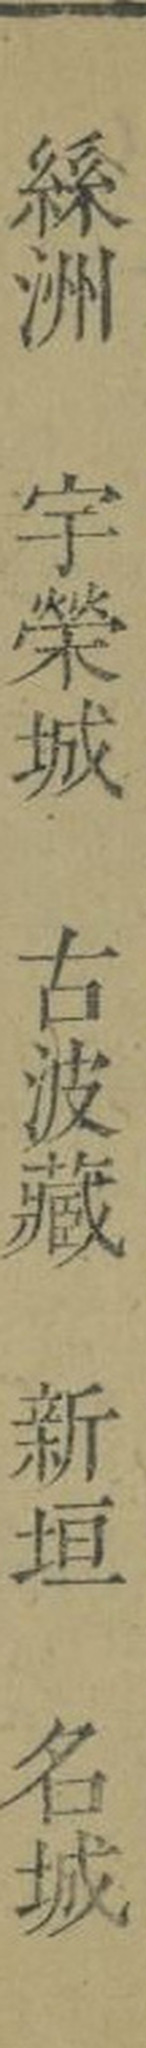糸洲宇栄城古波蔵新垣名城
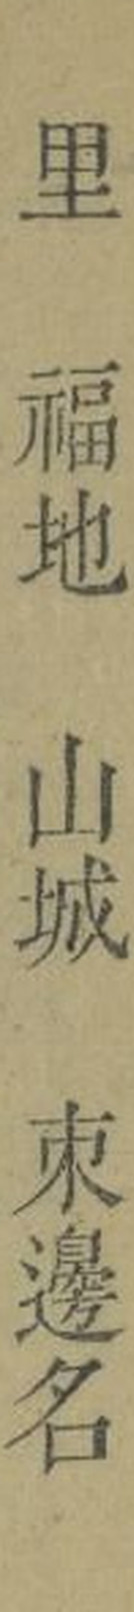里福地山城束辺名
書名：中山伝信録 巻四
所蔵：University of the Ryukyus Library
